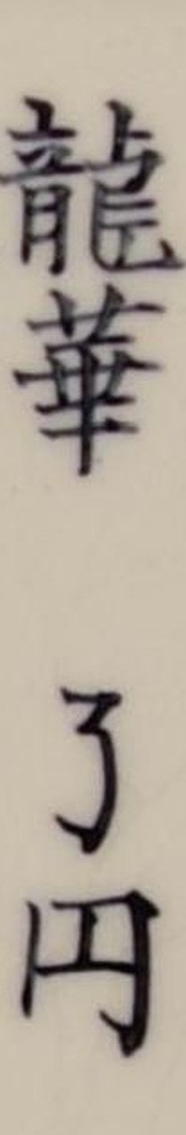龍華了円
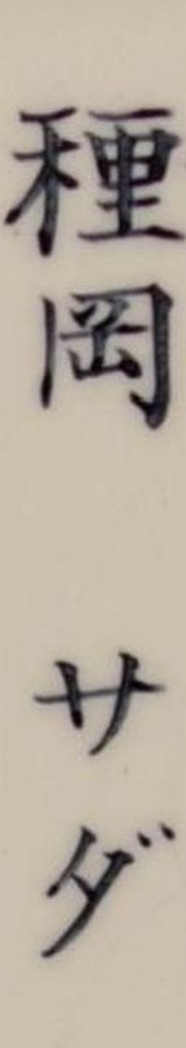種岡サダ
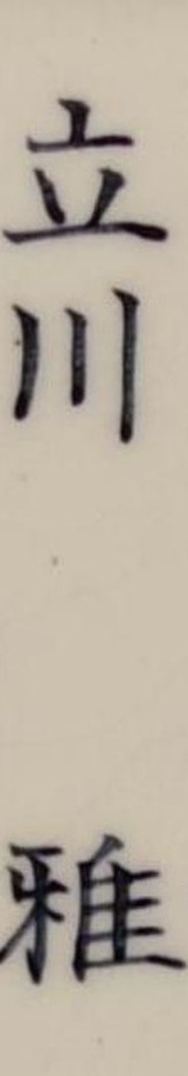立川雅
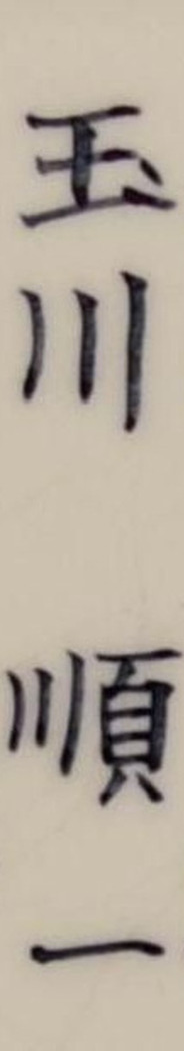玉川順一
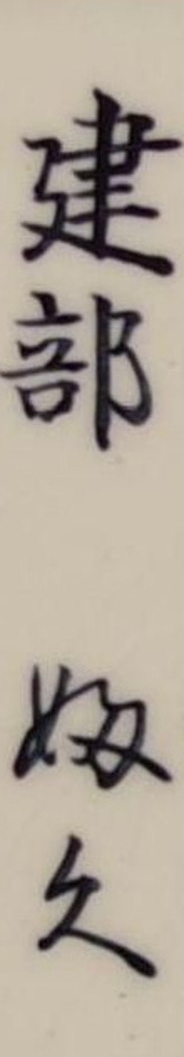建部ふく
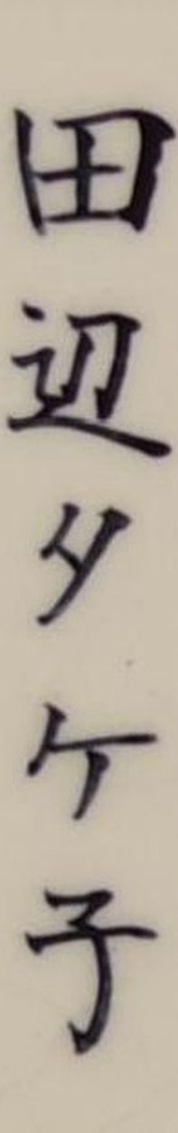田辺タケ子
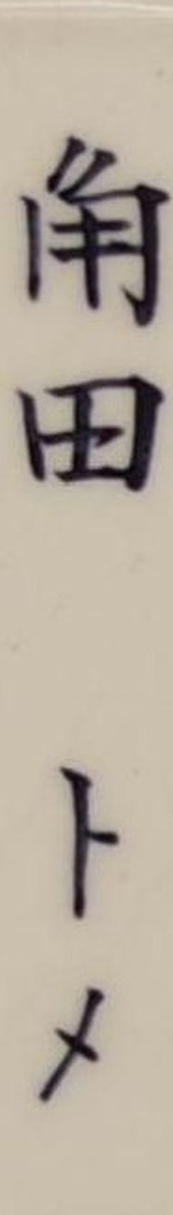角田トメ
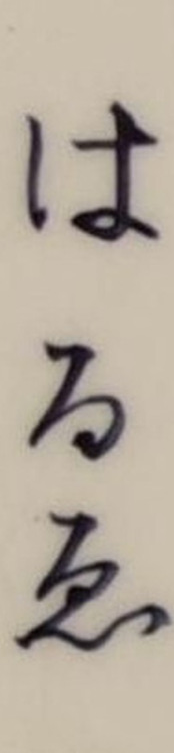はるえ
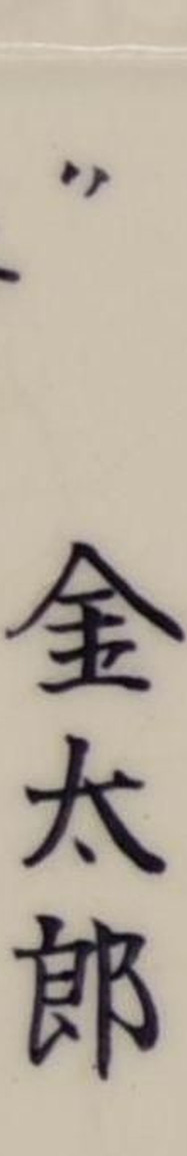金太郎
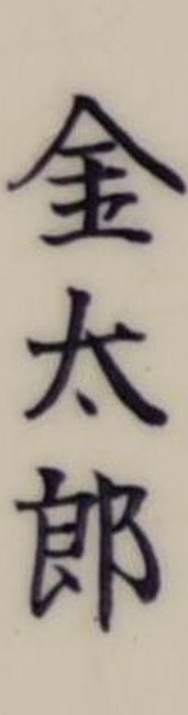金太郎
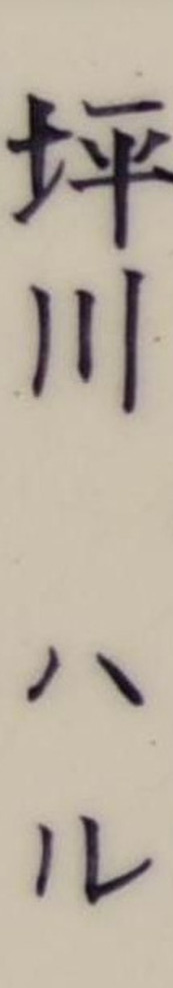坪川ハル
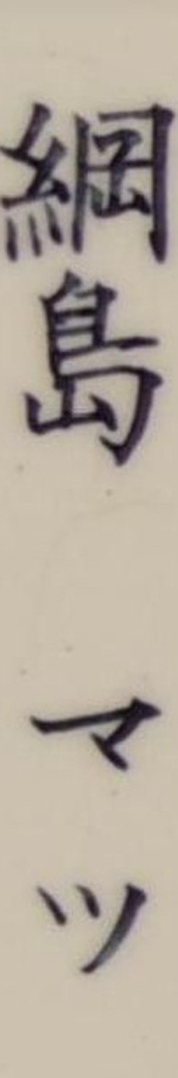綱島マツ
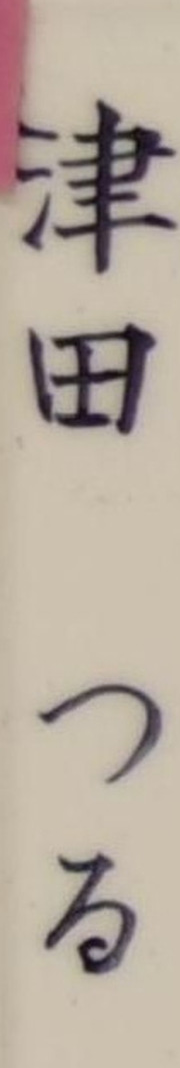津田つる

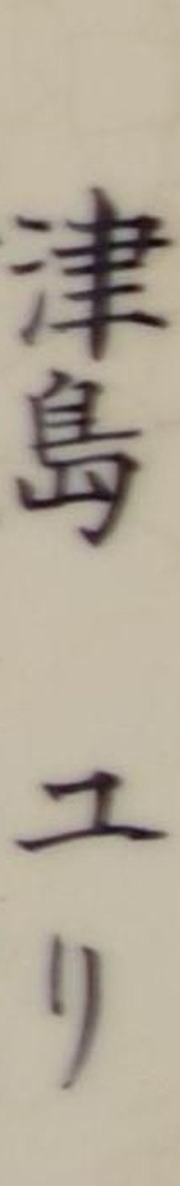津島ユリ
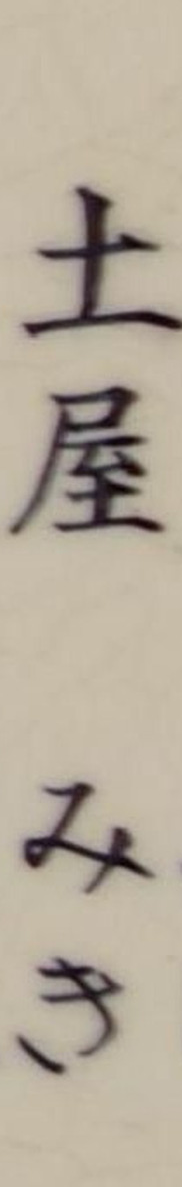土屋みき
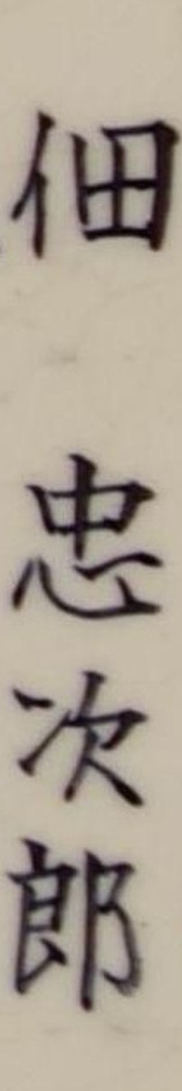佃忠次郎
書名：E~L
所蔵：高野山金剛峯寺
